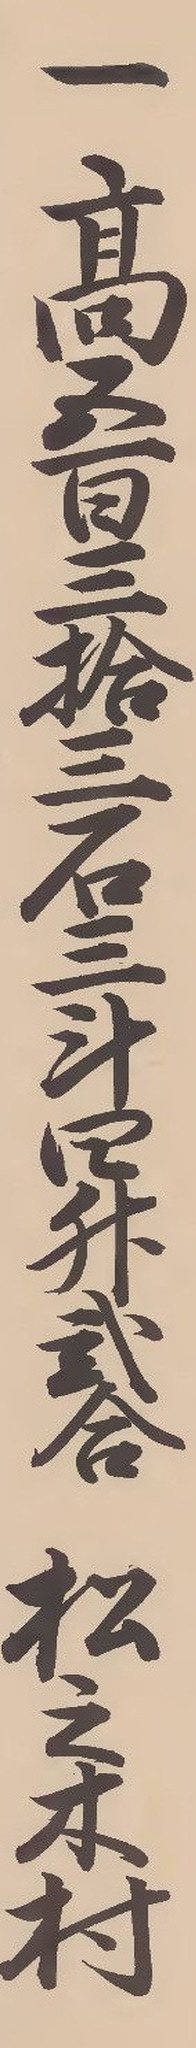一高五百三拾三石三斗四升弐合松之木村
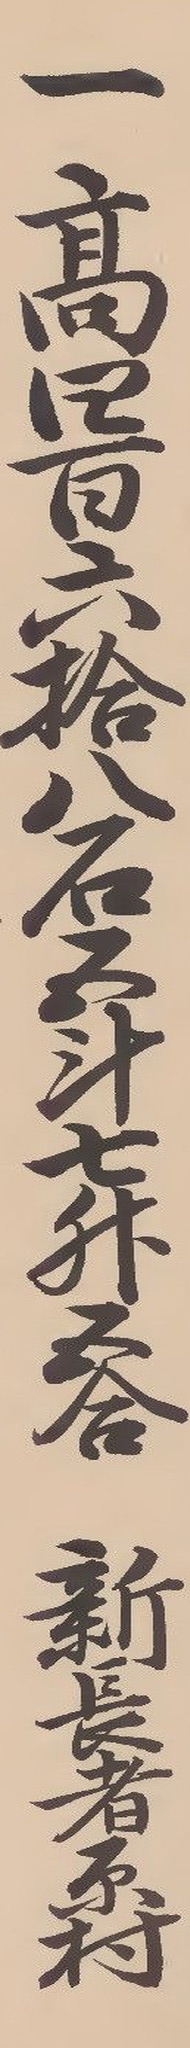一高四百六拾八石五斗七升五合新長者原村
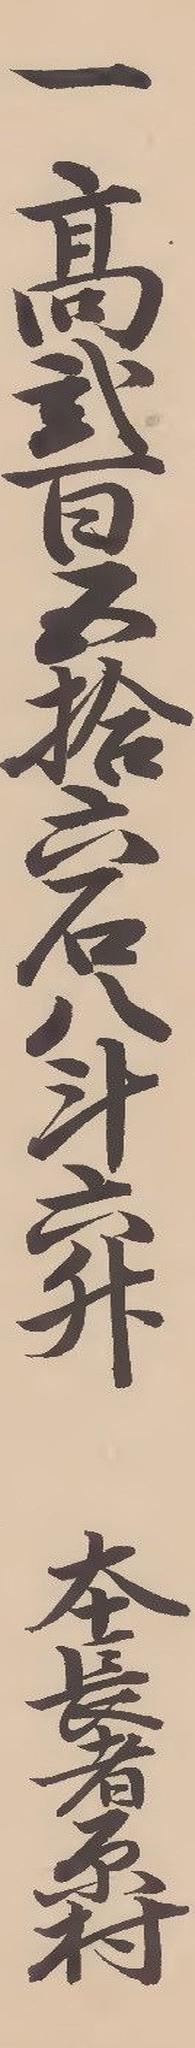一高弐百五拾六石八斗六升本長者原村
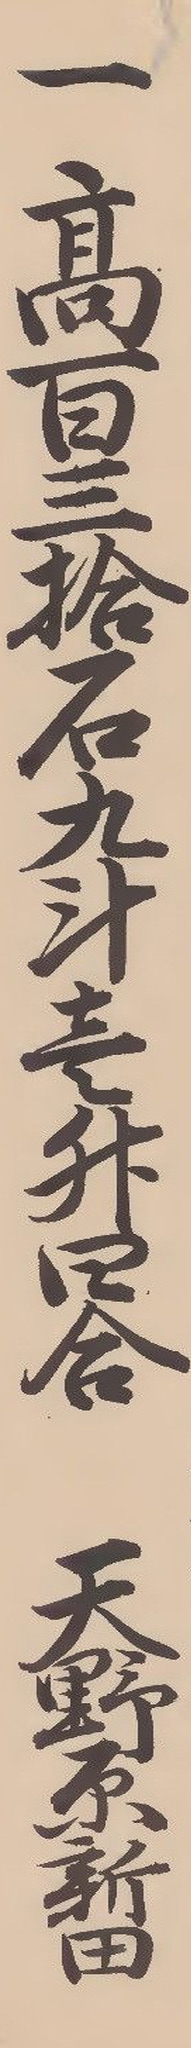一高百三拾石九斗壱升四合天野原新田
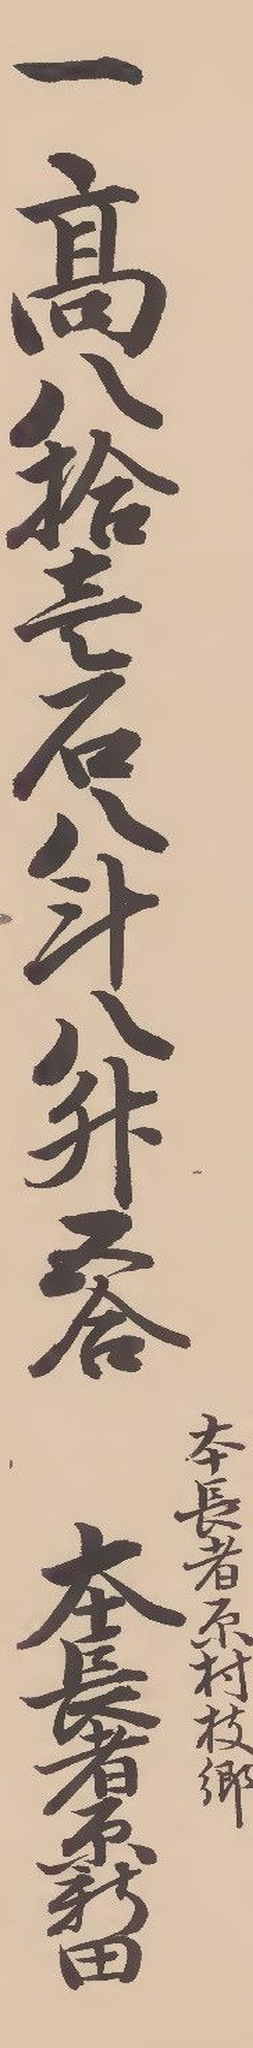一高八拾壱石八斗八升五合本長者原新田

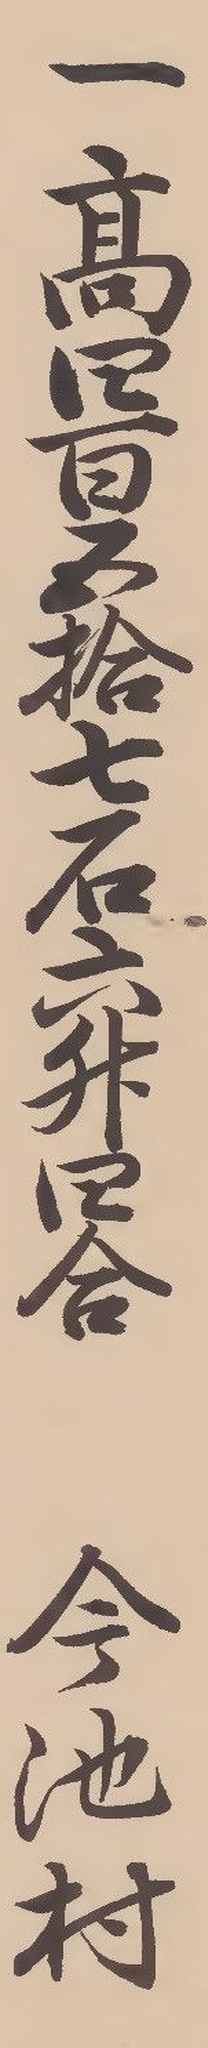一高四百五拾七石六升四合今池村
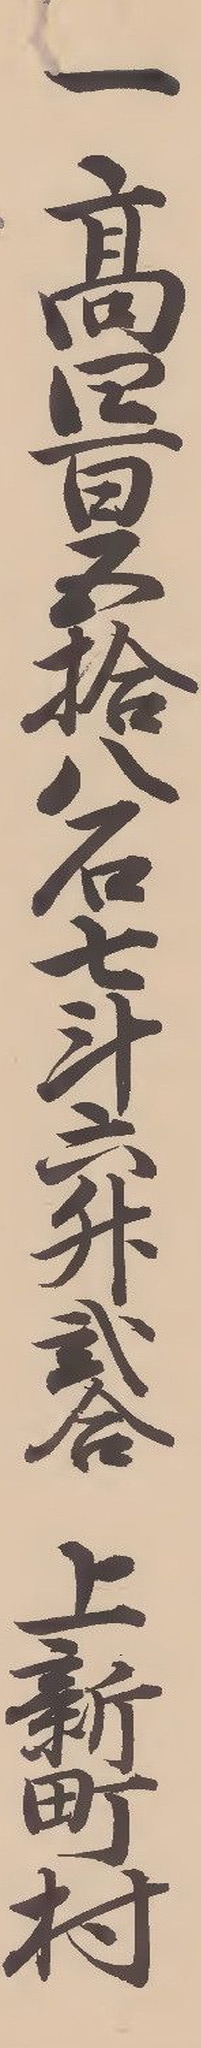一高四百五拾八石七斗六升弐合上新町村
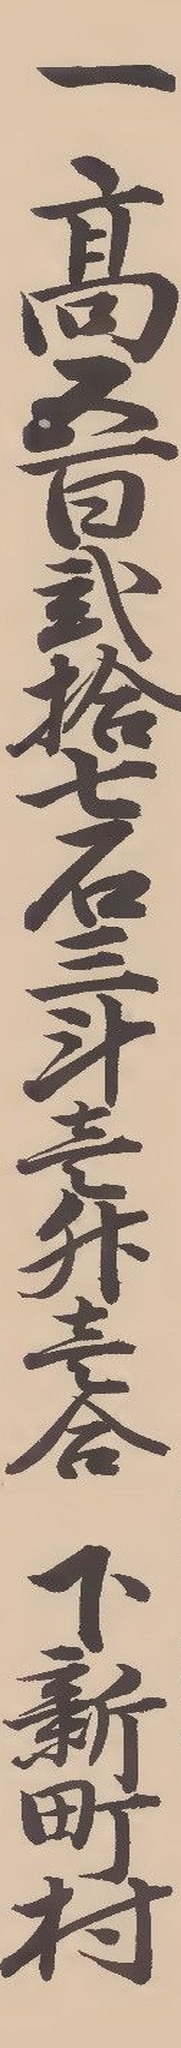一高五百弐拾七石三斗壱升壱合下新町村
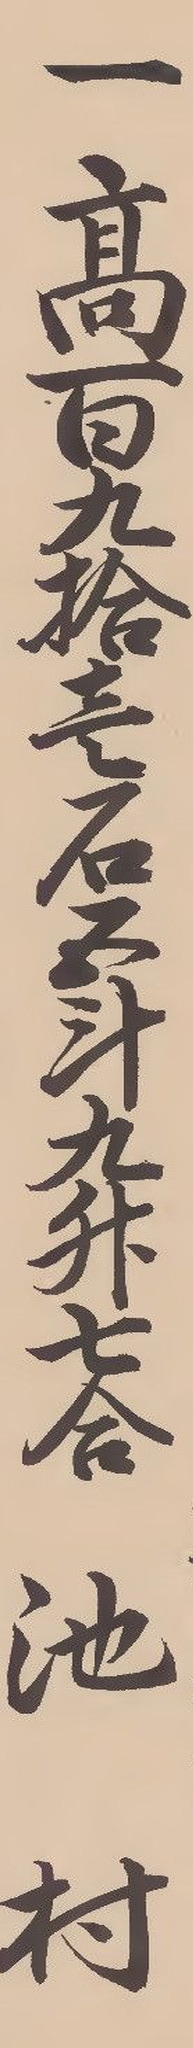一高百九拾壱石五斗九升七合池村
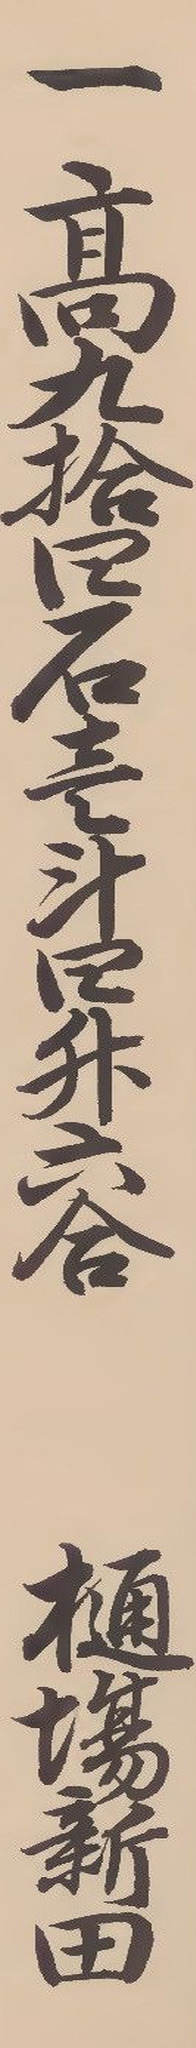一高九拾四石壱斗四升六合樋場新田
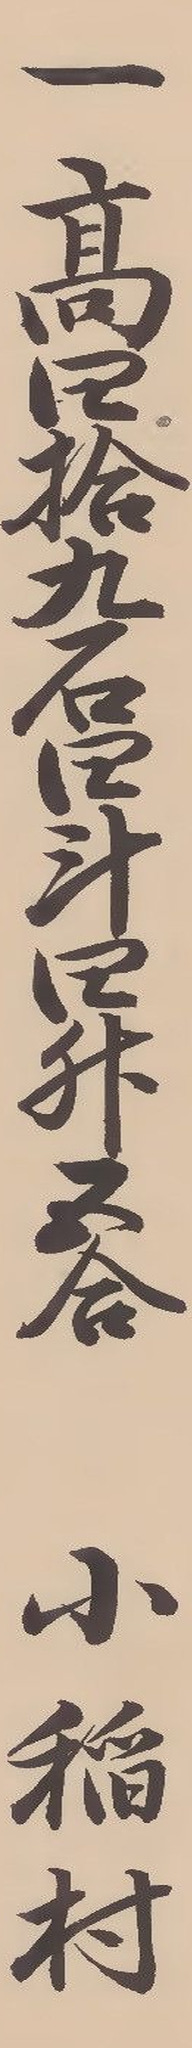一高四拾九石四斗四升五合小稲村
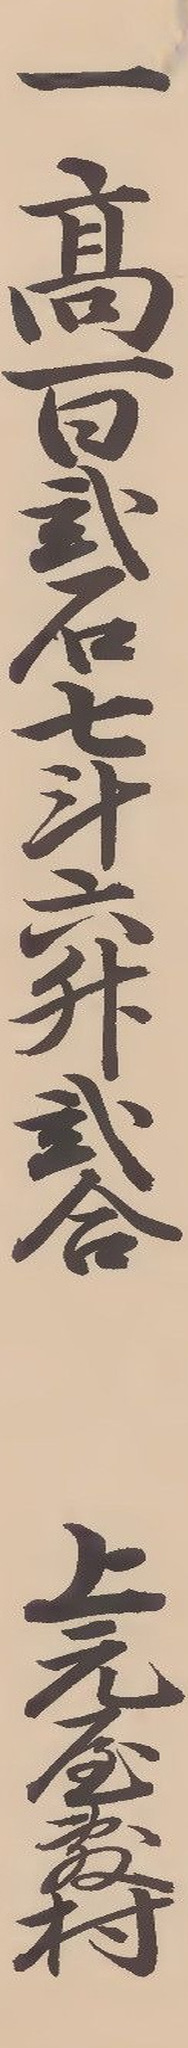一高百弐石七斗六升弐合上元屋敷村
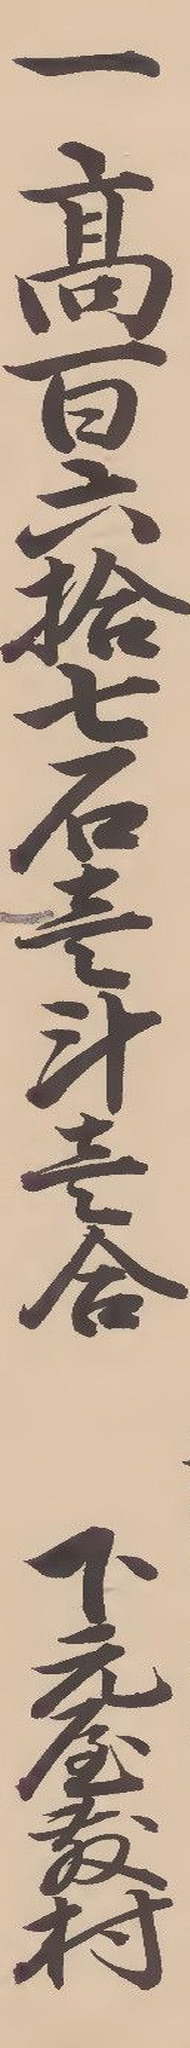一高百六拾七石壱斗壱合下元屋敷村

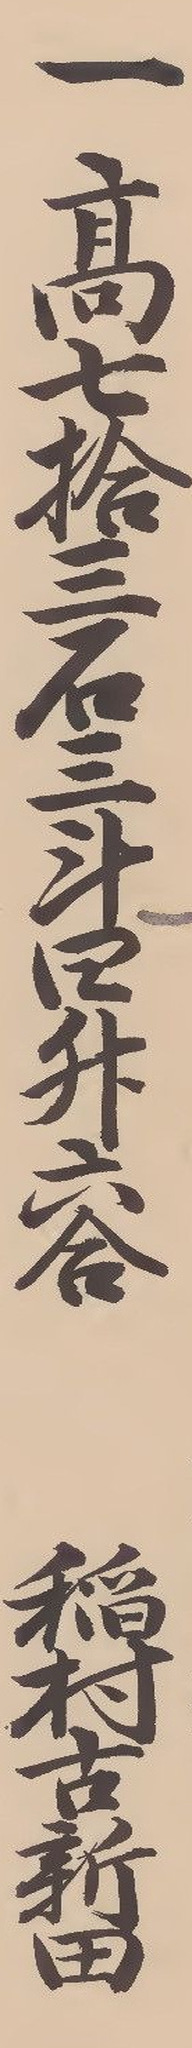一高七拾三石三斗四升六合稲村古新田
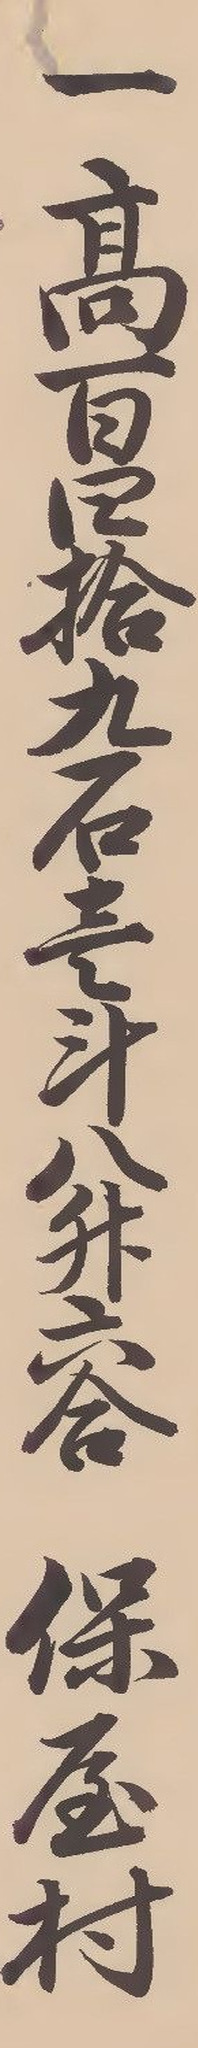一高百四拾九石壱斗八升六合保屋村
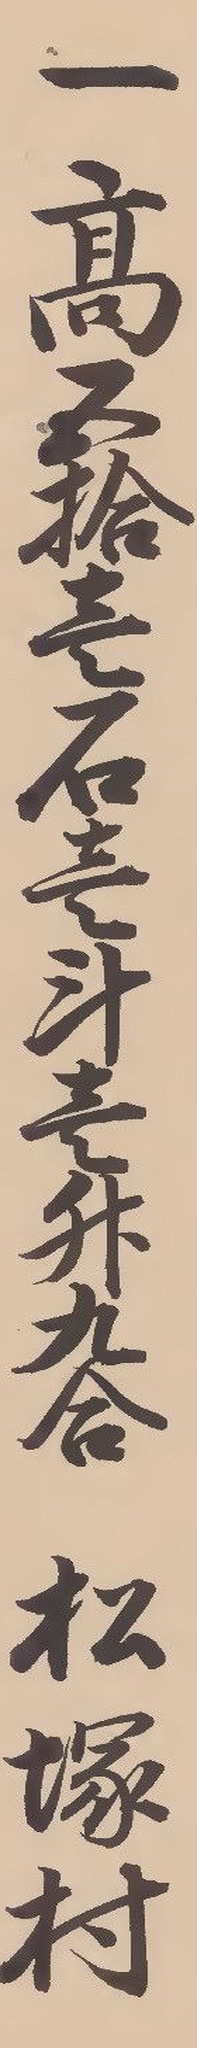一高五拾壱石壱斗壱升九合松塚村
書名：越後国郷帳　上
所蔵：国立公文書館 National Archives of Japan
